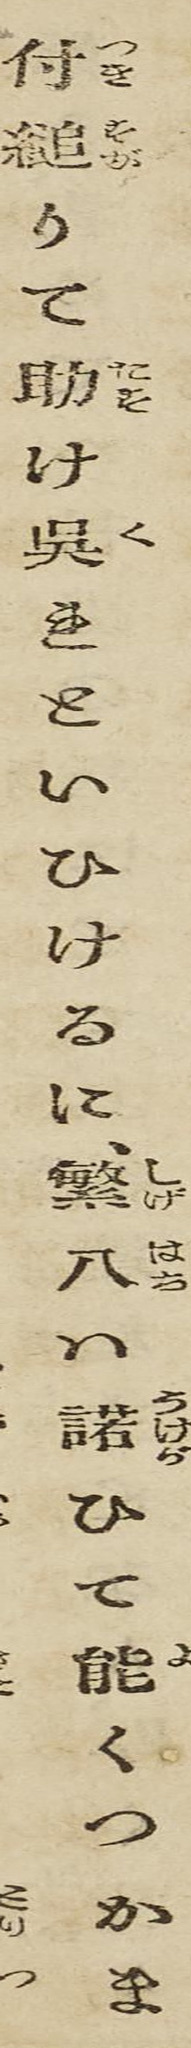付縋りて助け呉れといひけるに、繁八は諾ひて能くつかま
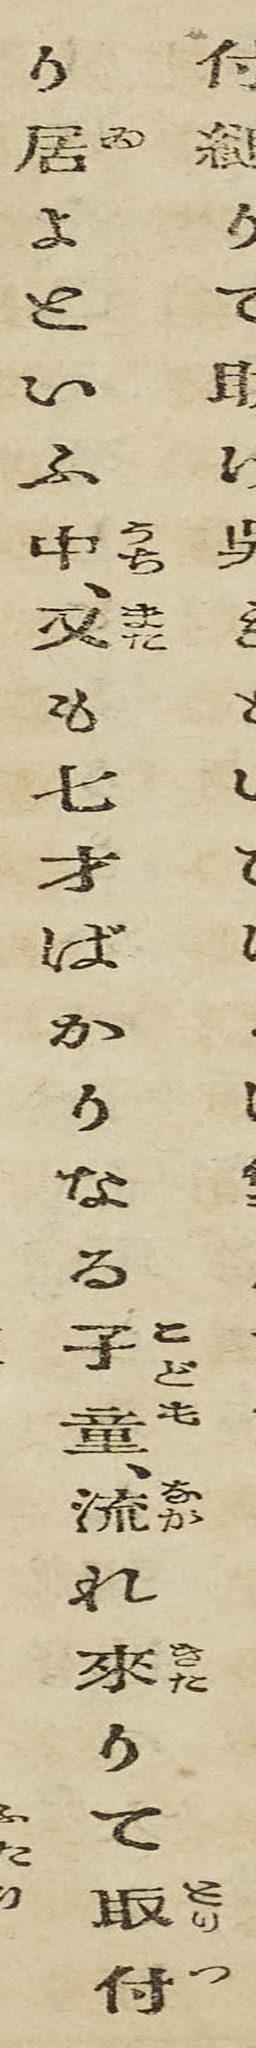り居よといふ中、又も七才ばかりなる子童、流れ来りて取付
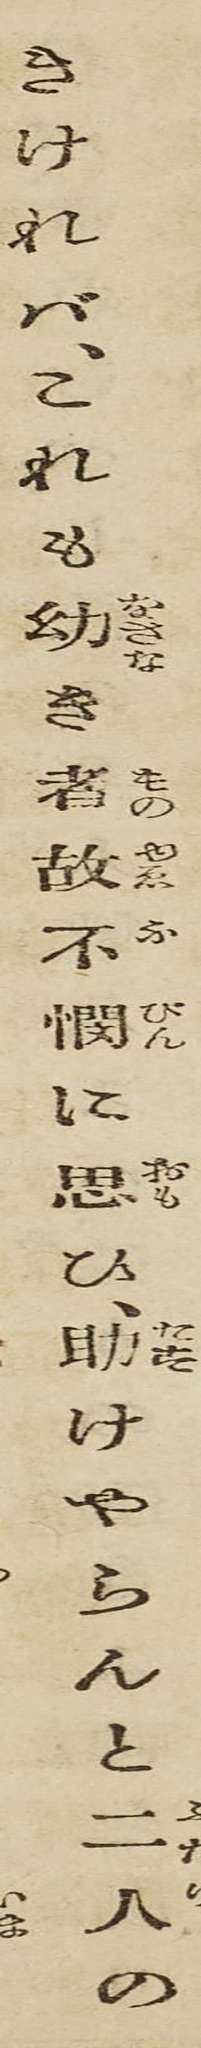きければ、これも幼き者故不憫に思ひ、助けやらんと二人の
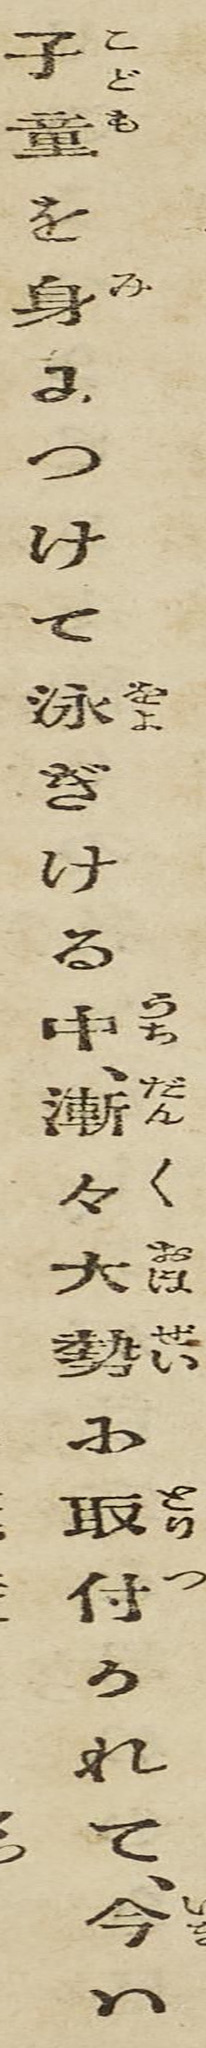子童を身につけて泳ぎける中、漸々大勢に取付かれて、今は
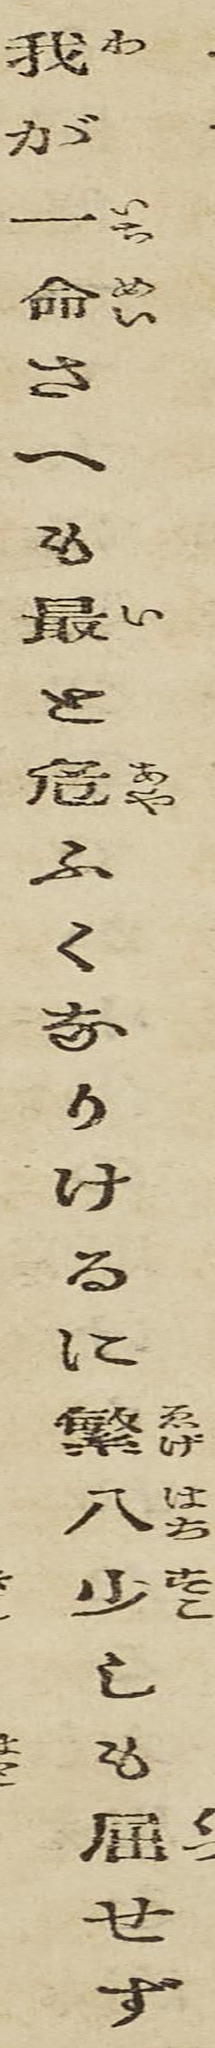我が一命さへも最と危ふくなりけるに繁八少しも屈せず
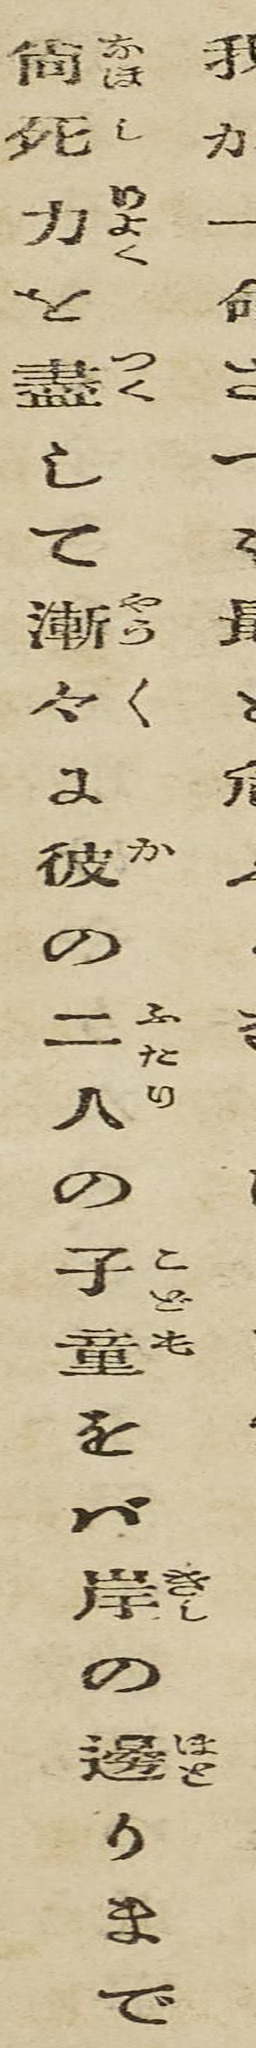尚死力を尽して漸々に彼の二人の子童をば岸の辺りまで

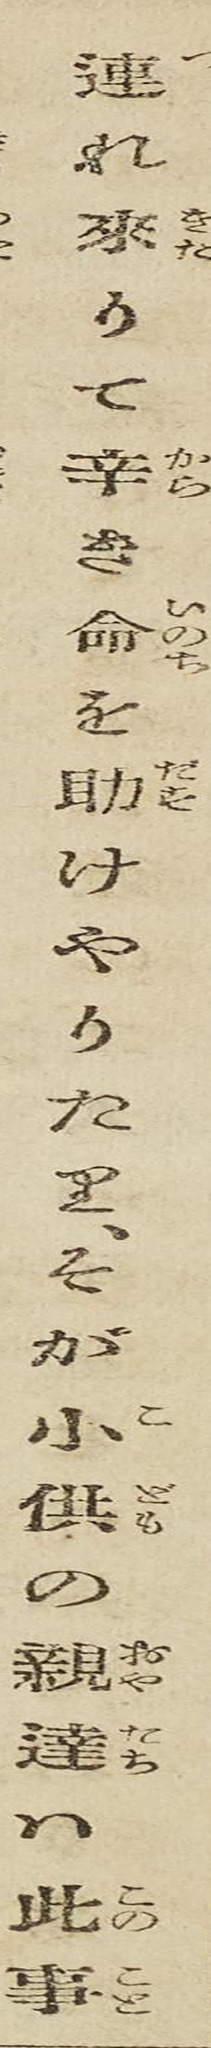連れ来りて辛き命を助けやりたり、そが子供の親達は此事
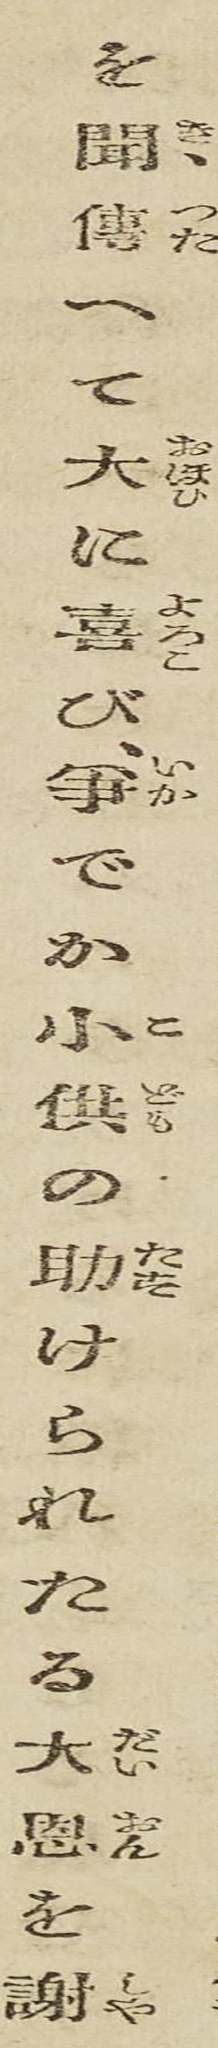を聞伝へて大に喜び、争でか小供の助けられたる大恩を謝
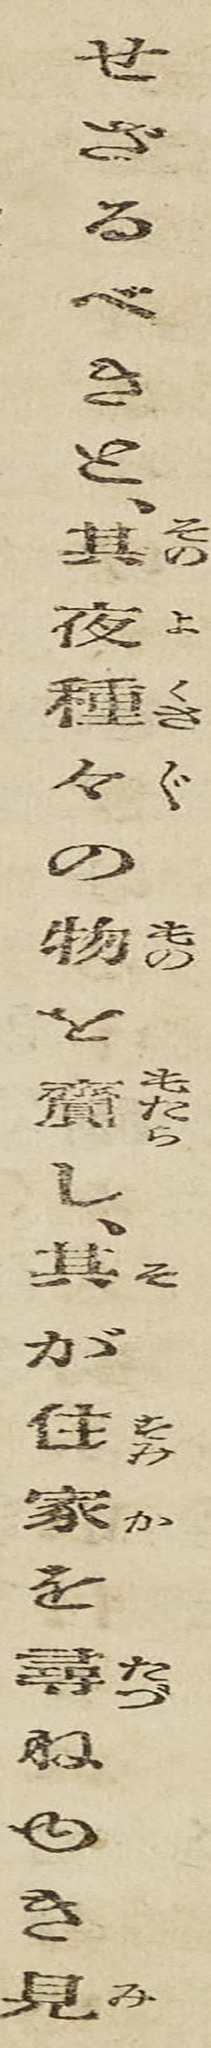せざるべきと、其夜種々の物を齎し、其が住家を尋ねゆき見
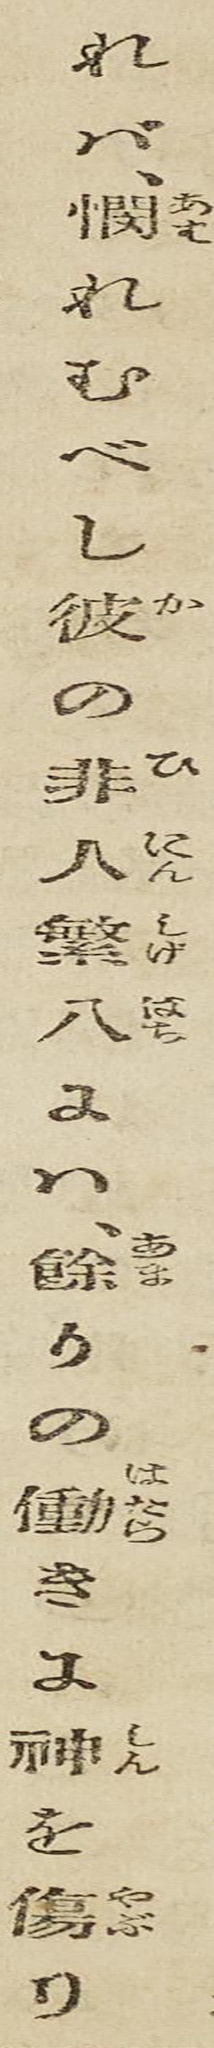れば、憫れむべし彼の非人繁八には、余りの働きに神を傷り
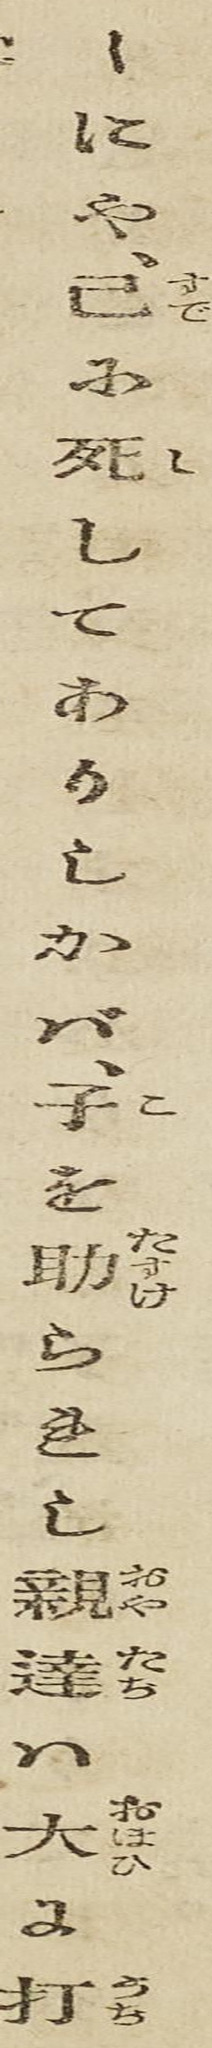しにや、已に死してありしかば、子を助けられし親達は大に打
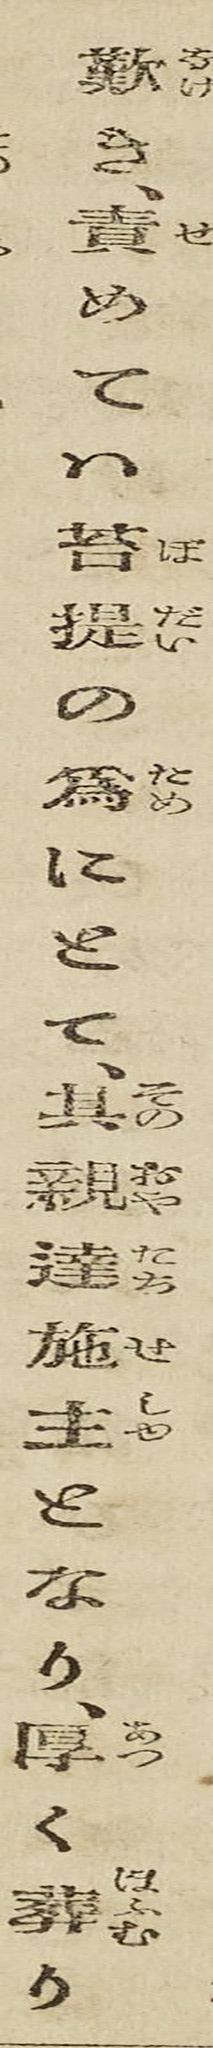歎き、責めては菩提の為にとて、其親達施主となり、厚く葬り
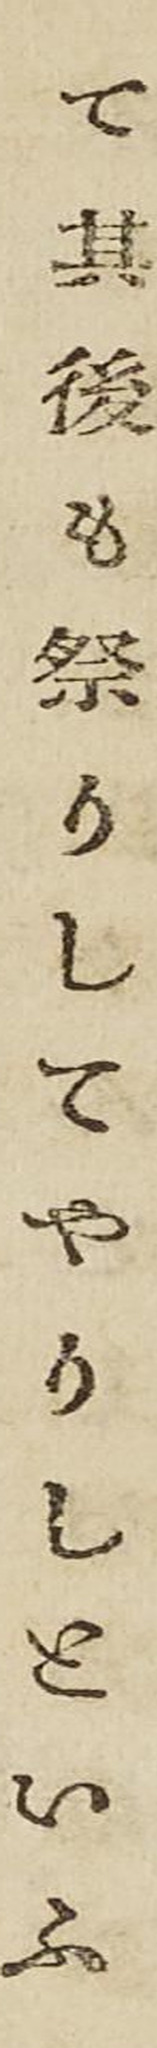て其後も祭りしてやりしといふ
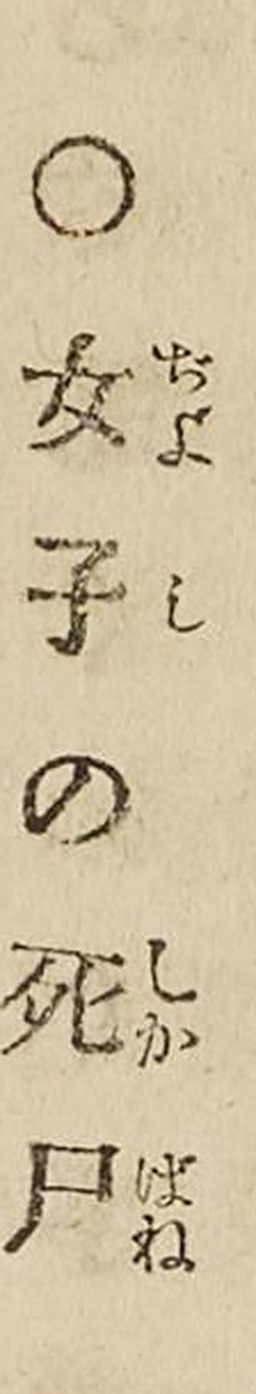○女子の死尸
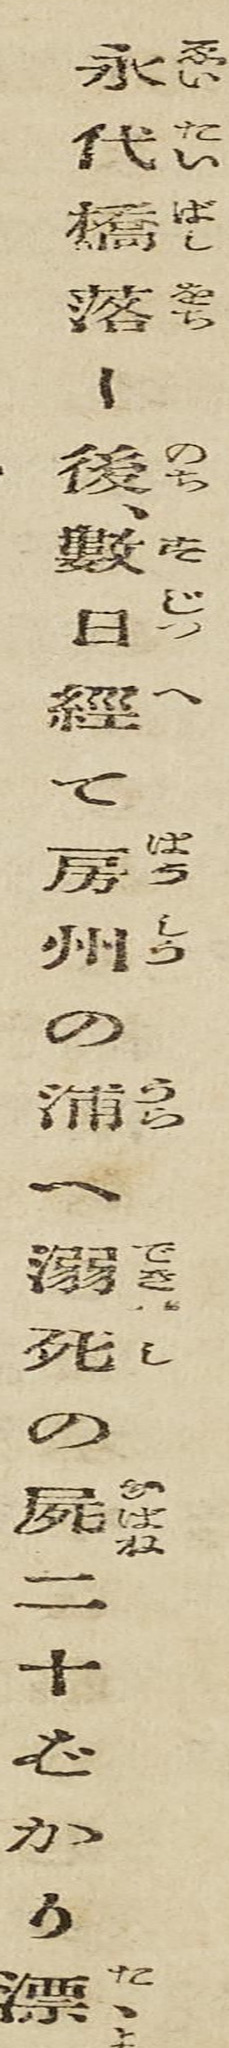永代橋落し後、数日経て房州の浦へ溺死の屍二十ばかり漂
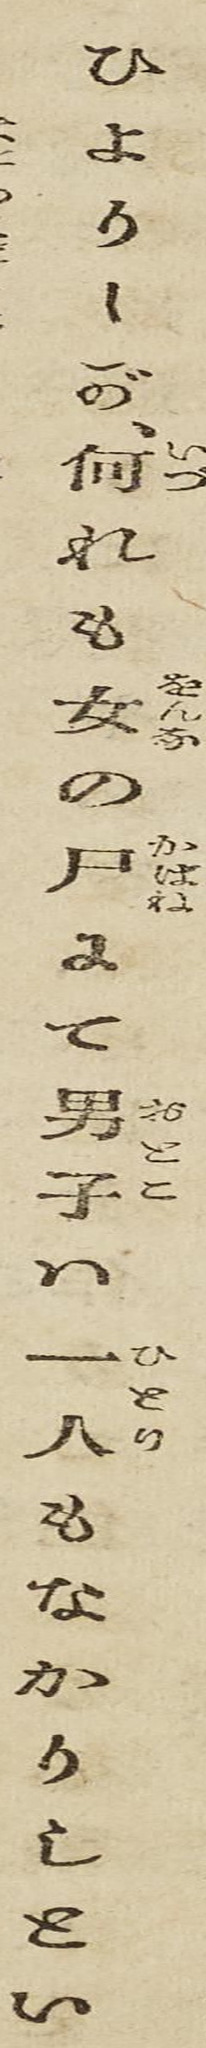ひよりしが、何れも女の尸にて男子は一人もなかりしとい
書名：永代惨話　文化の夢　全
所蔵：東京大学地震研究所図書室 Earthquake Research Institute Library, The University of Tokyo, JAPAN
